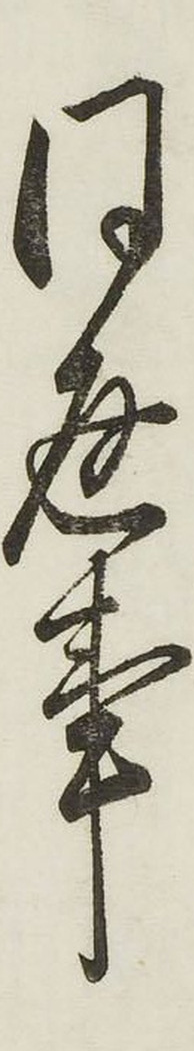同返事
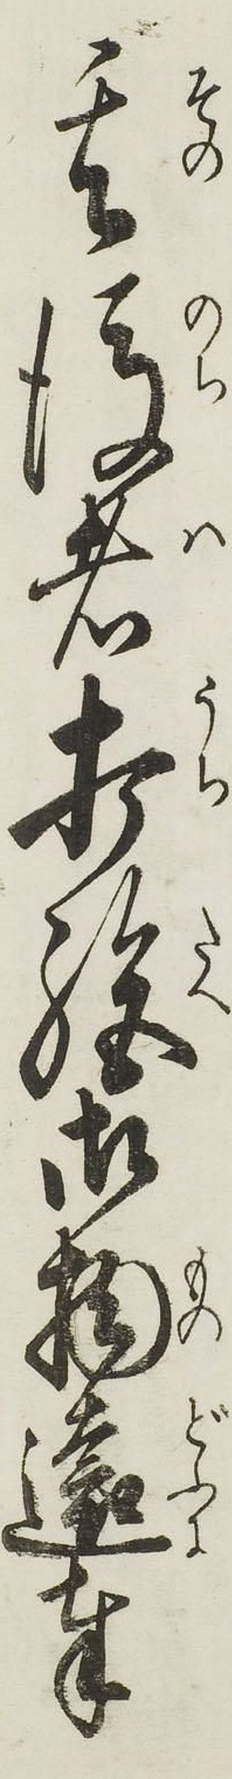其後者打絶御物遠奉
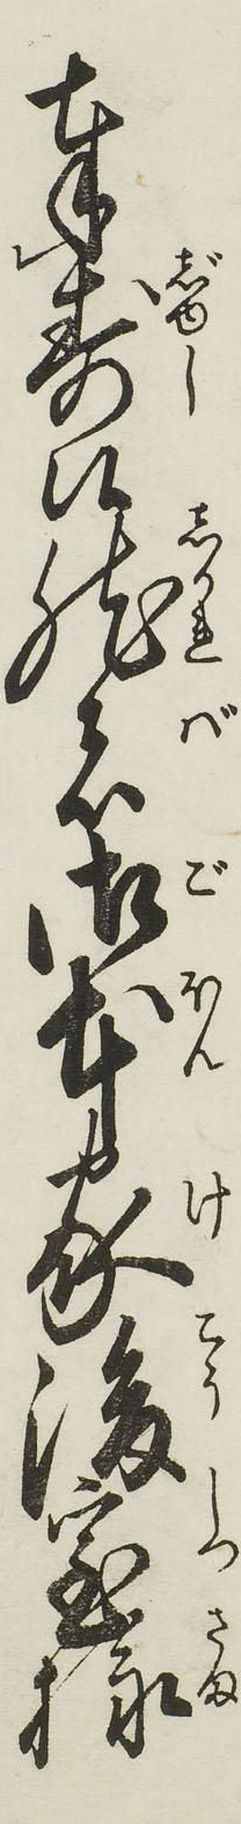奉寿候然者御本家後室様
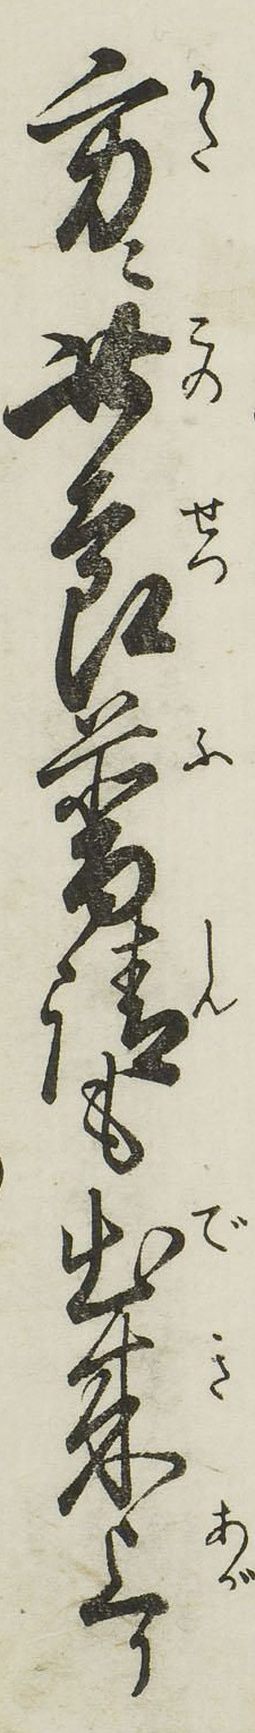方此節普請も出来上り

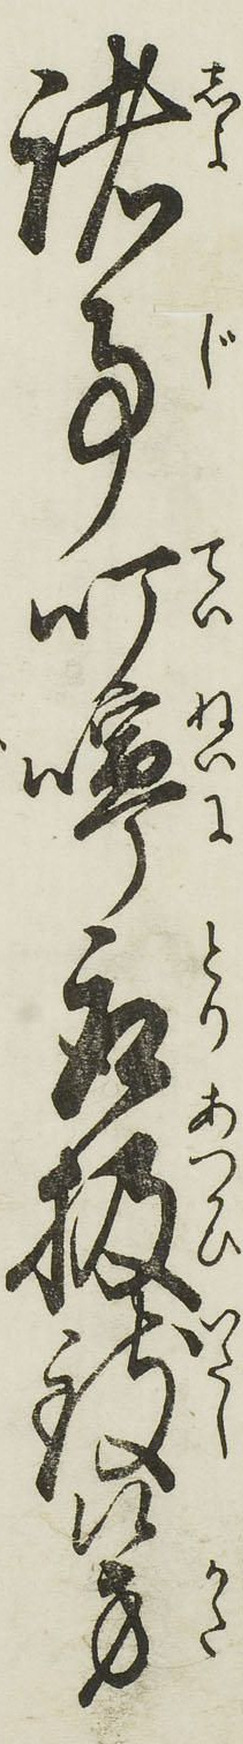諸事叮嚀取扱致候方
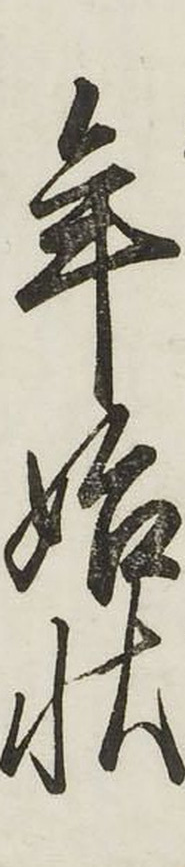年始状
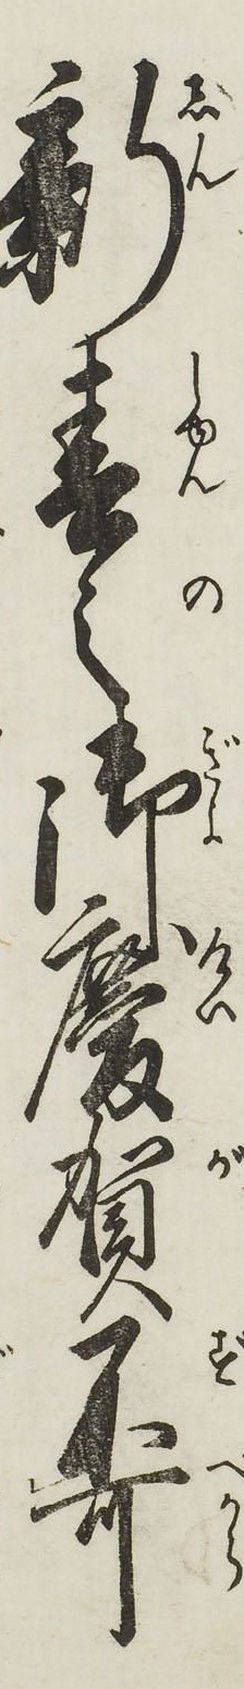新春之御慶賀不可
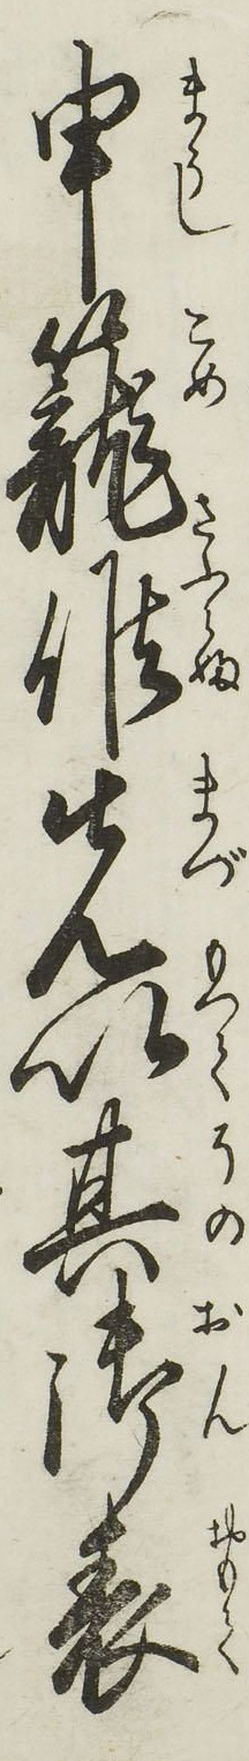申籠候先以其御表
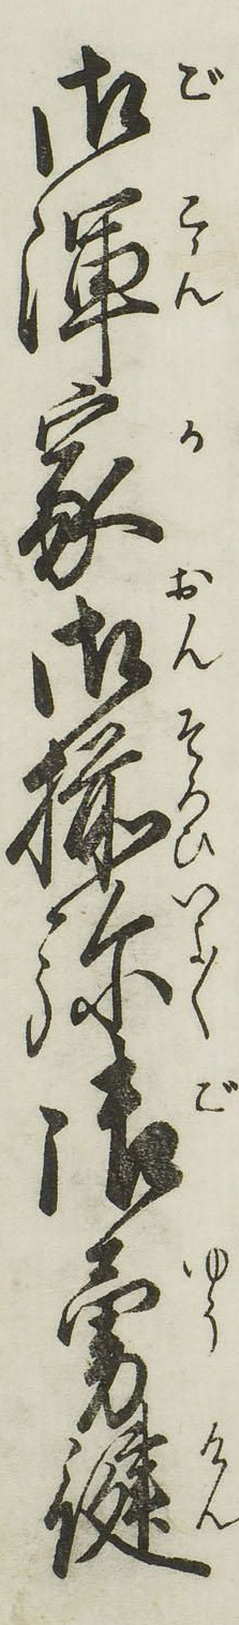御渾家御揃弥御勇健

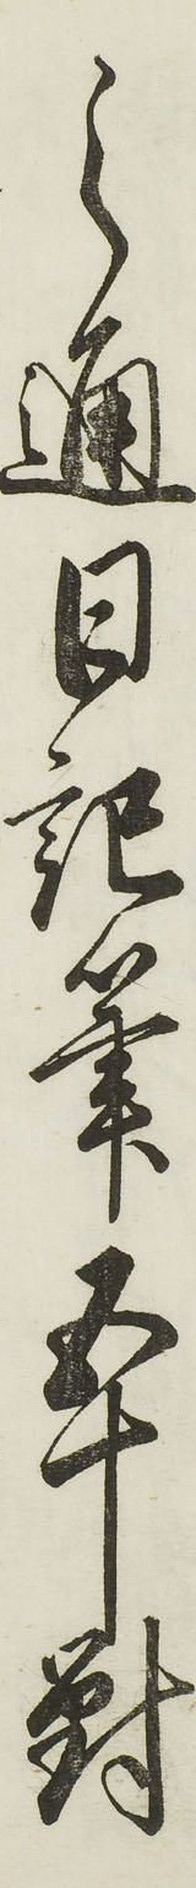之通日記筆五十対
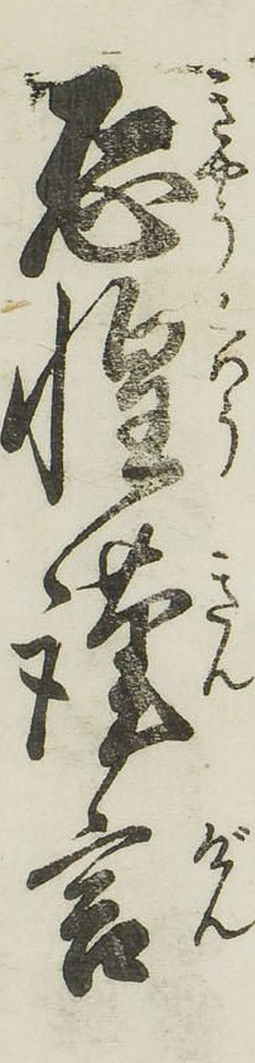恐惶謹言

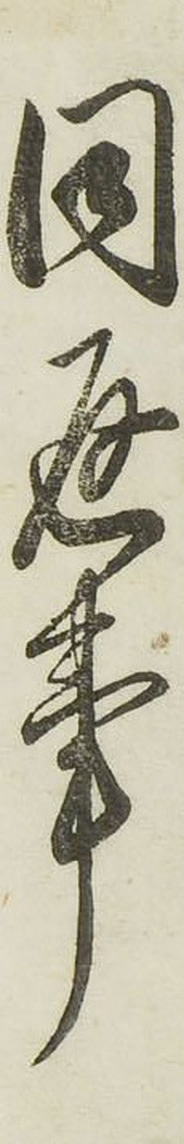同返事
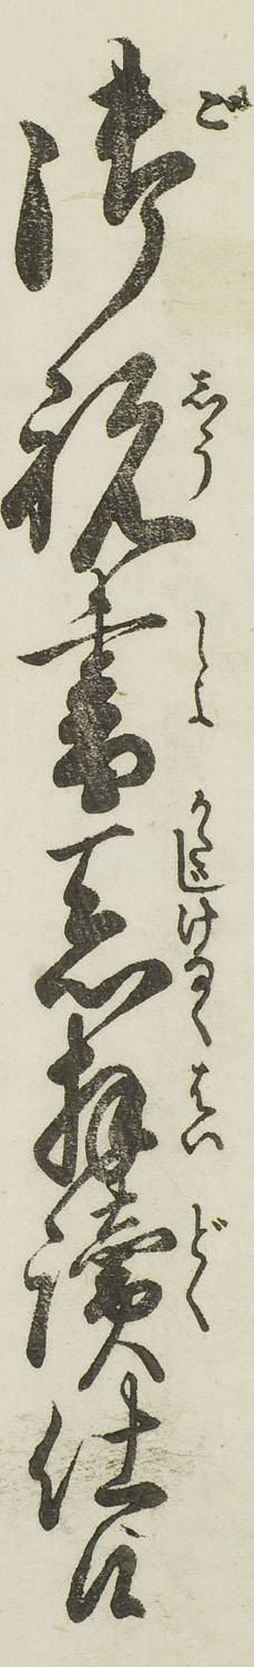御祝書忝拝読仕候
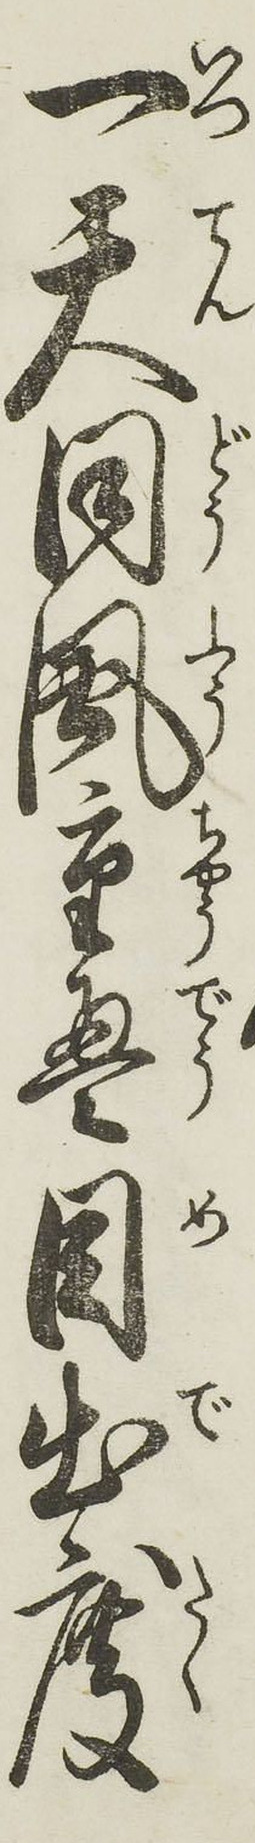一天同風重畳目出度

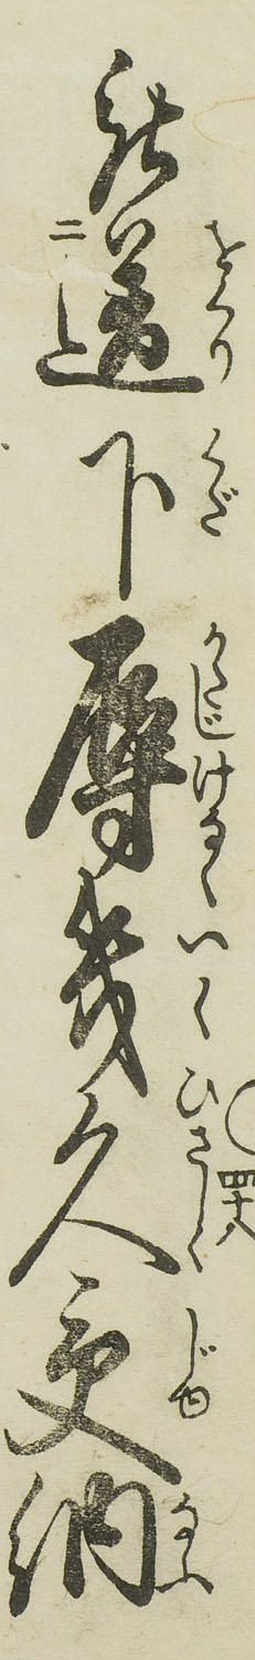被送下辱幾久受納
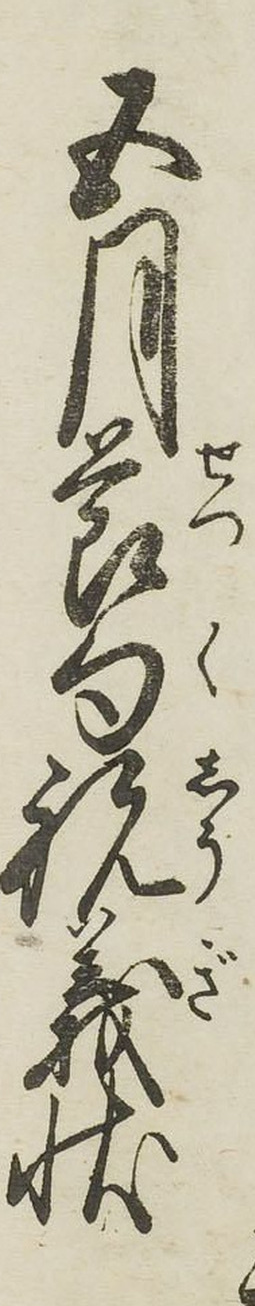五月節句祝義状
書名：商人書翰便覧
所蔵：東京学芸大学教育コンテンツアーカイブ
